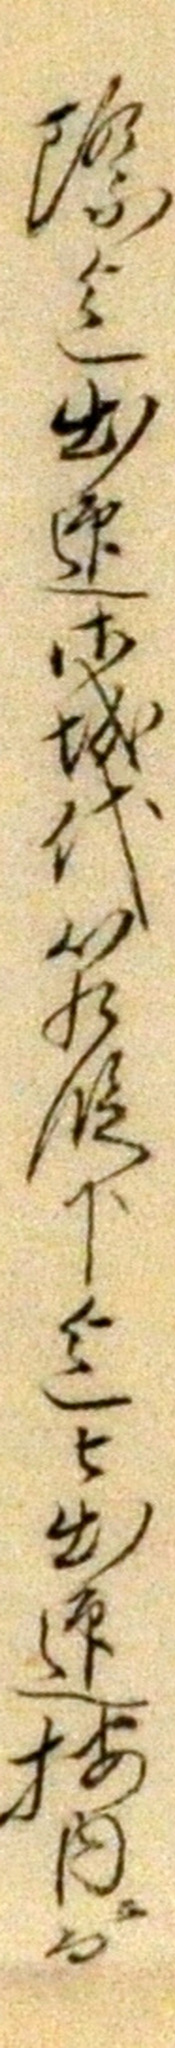際迄出迎御城代箱段下迄被出迎案内ニ而
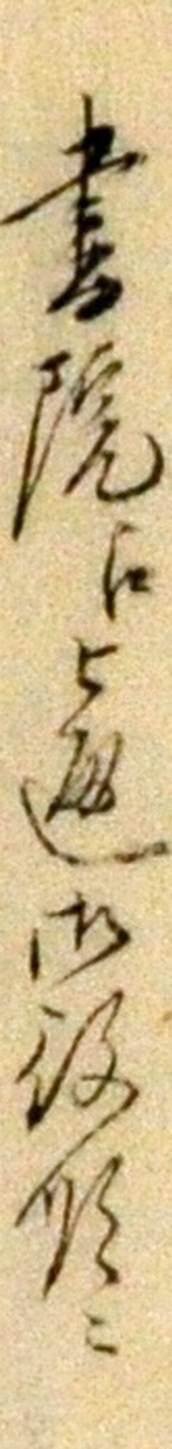書院え被通御役順ニ
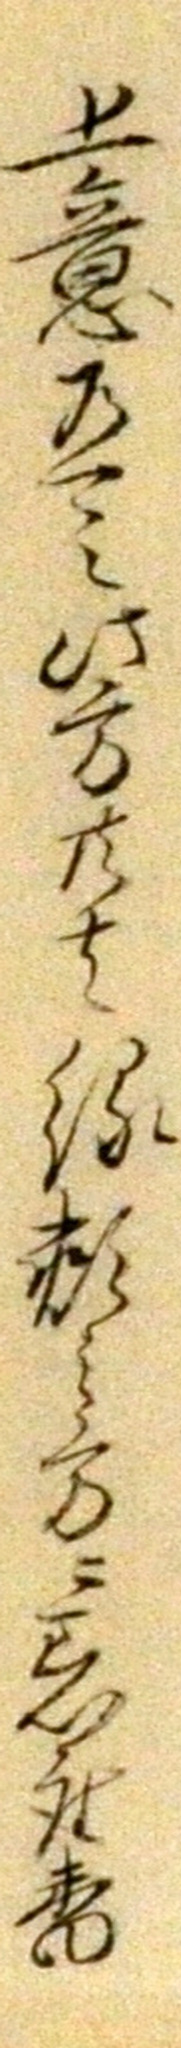上意有之此方共は縁頬之方ニ着座番
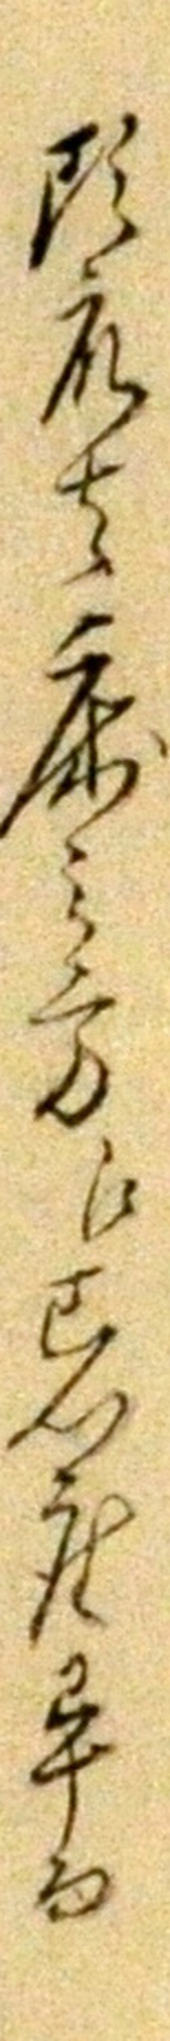頭衆は床之方え着座畢而
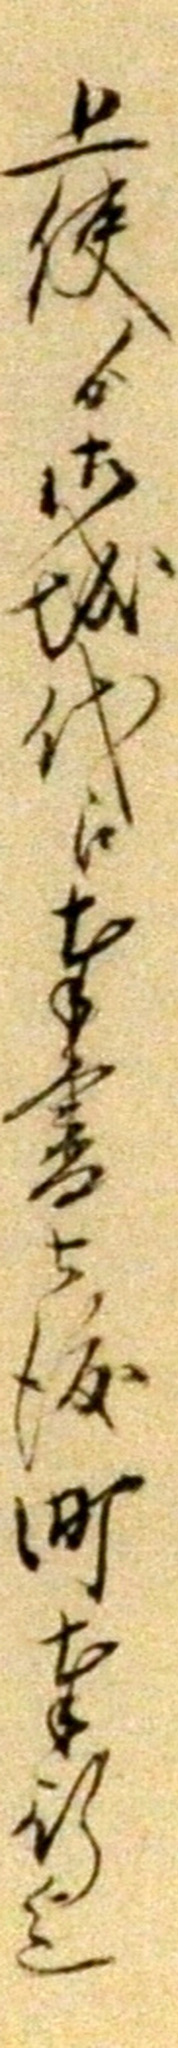上使ゟ御城代え奉書被渡町奉行迄
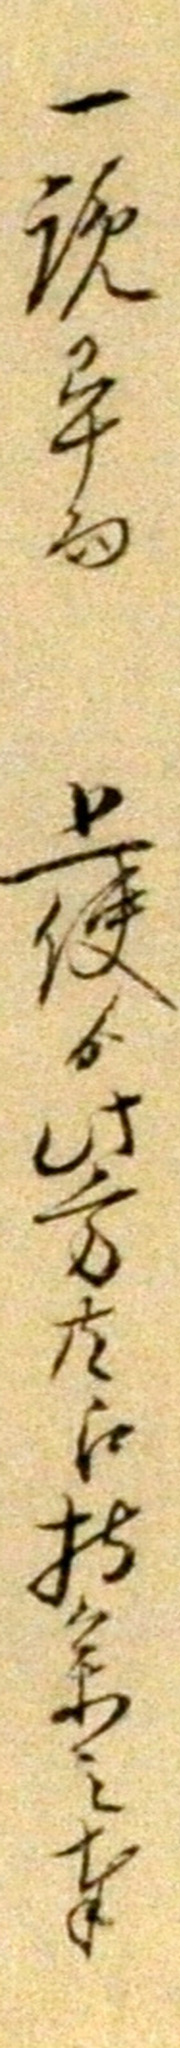一覧畢而上使ゟ此方共え持参之奉
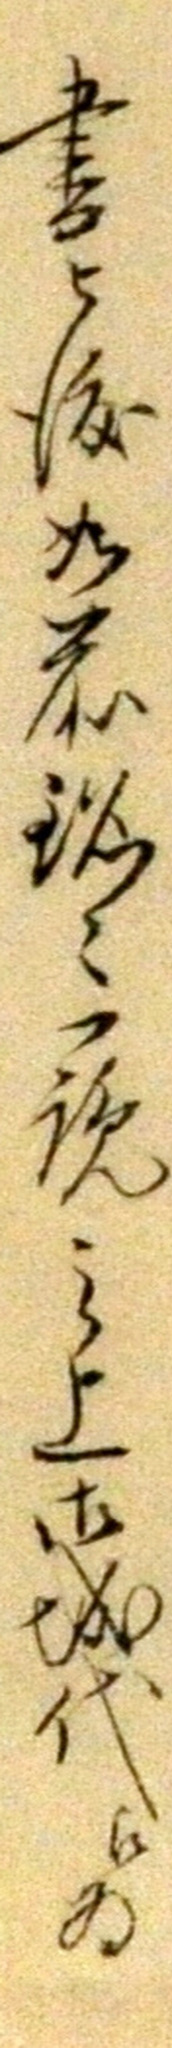書被渡如前銘々一覧之上御城代え為
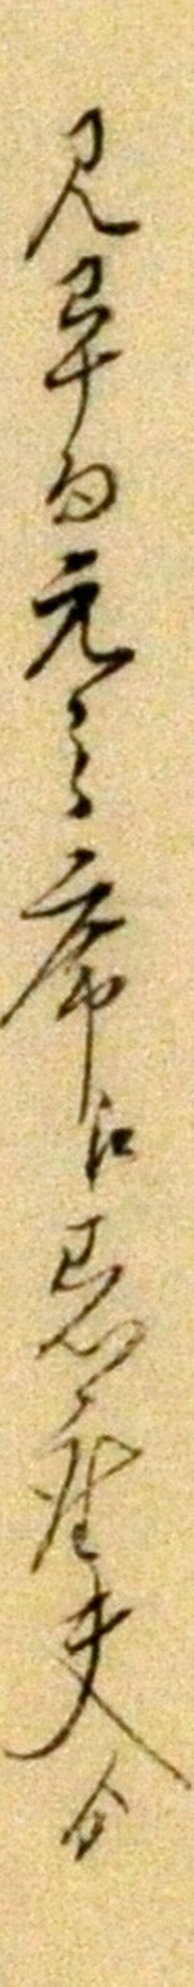見畢而元之席え着座夫ゟ
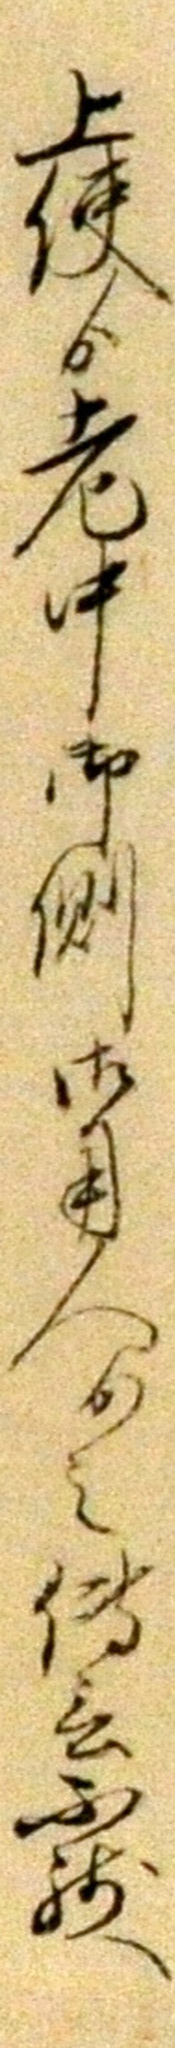上使ゟ老中御側御用人ゟ之伝言不致
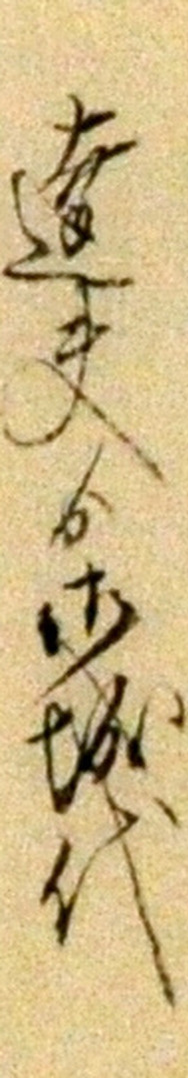達夫ゟ御城代
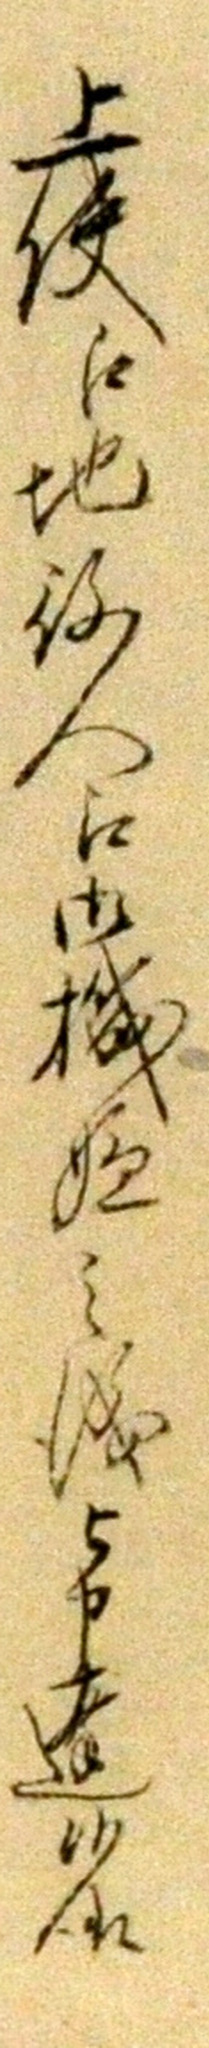上使え地役人え御機嫌之儀被申達候様
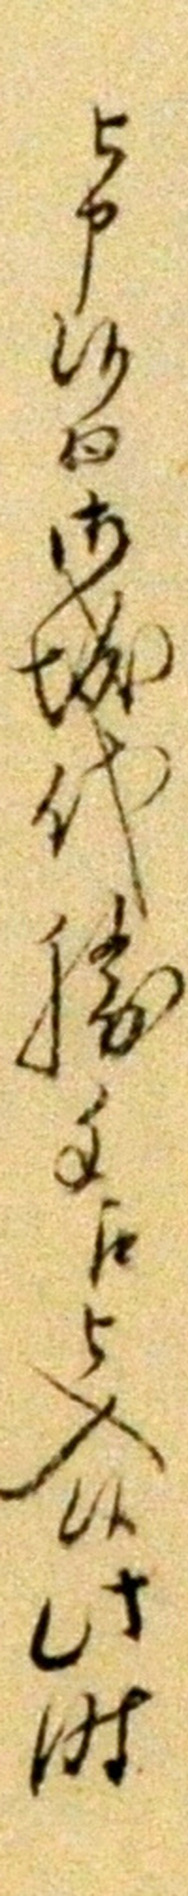被申候而御城代勝手え被入候此時
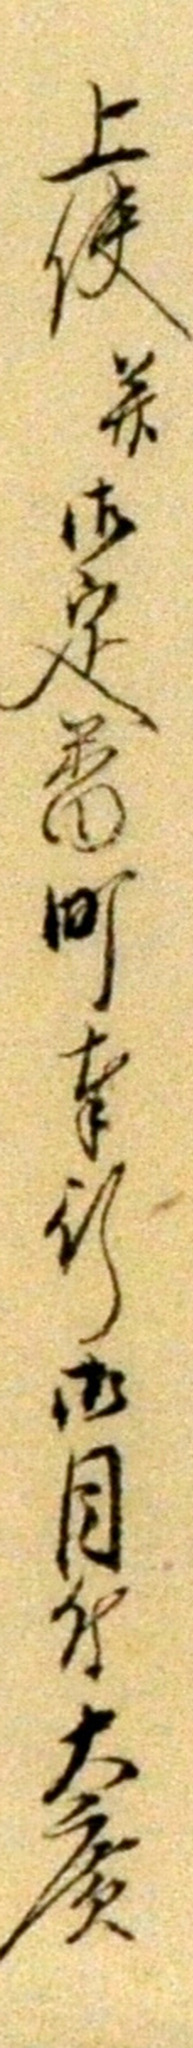上使并御定番町奉行御目付大広
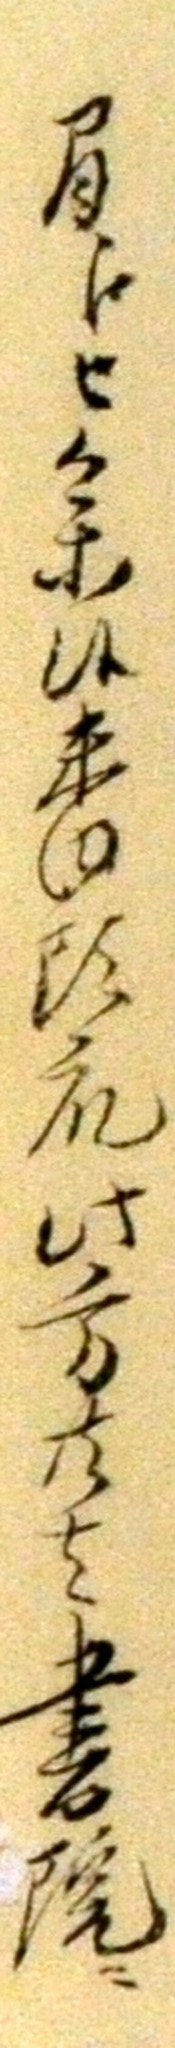間え被参候番頭衆此方共は書院ニ

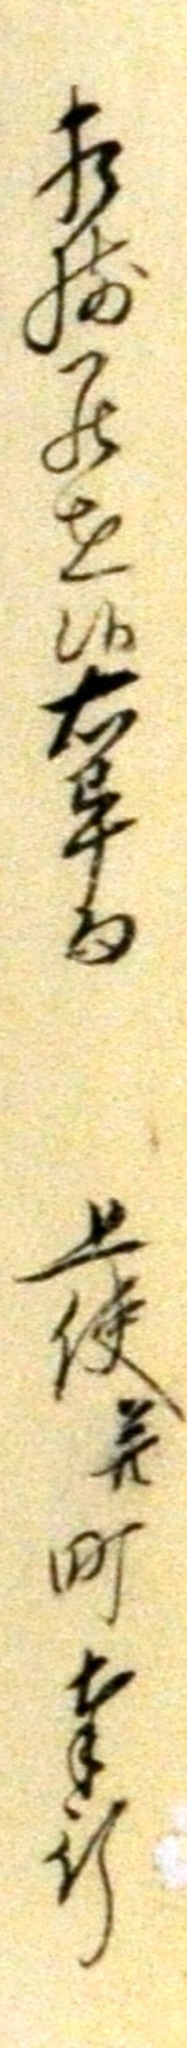相揃罷在候右卆而上使并町奉行
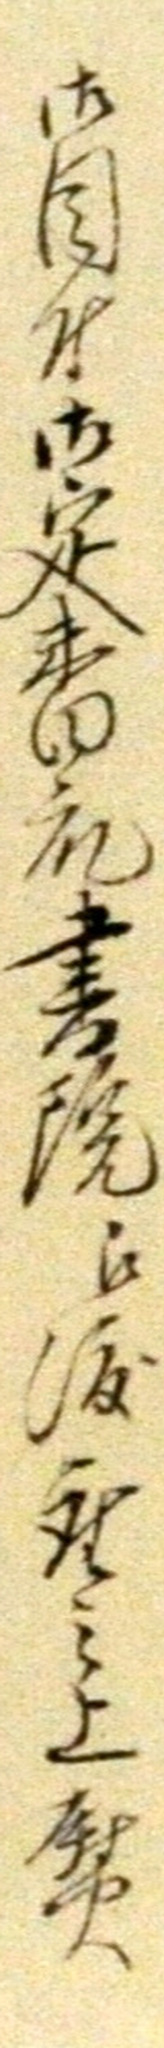御目付御定番衆書院え渡座之上熨
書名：大阪加番関係諸書留〔一括〕
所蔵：伊那市立高遠町図書館・合同会社AMANE
